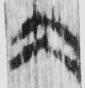大
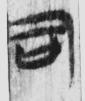司
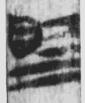馬
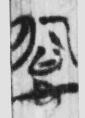○（悼）
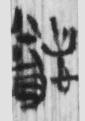○（滑）
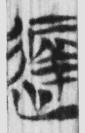𬨭（將）
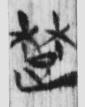楚
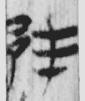邦
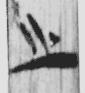之
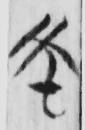帀（師）
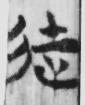徒
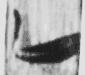㠯（以）
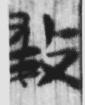○（救）
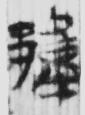郙
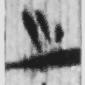之
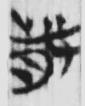歲（歲）
